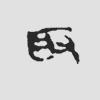取
